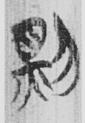則
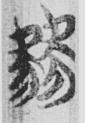肆
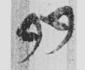多
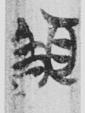○（聞）
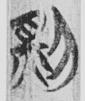則
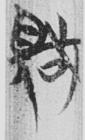○（惑）
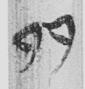多
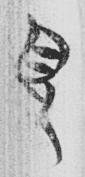見
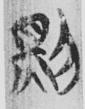則
